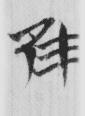隹
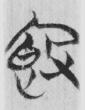{勹㿝攴}
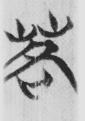茖
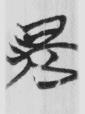是
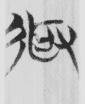{彳取}
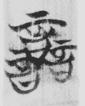譶
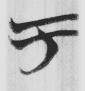于
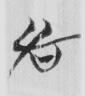左
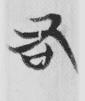右
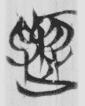𪴿
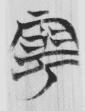𩁹
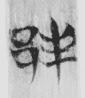邦
